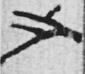之
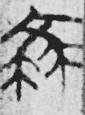衰
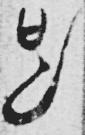也
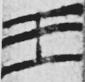王
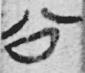公
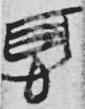恥
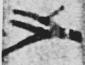之
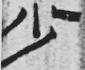少（小）
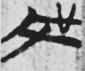吝（旻）
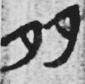○（疑）
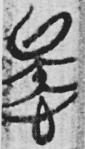矣疑
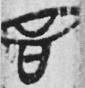言
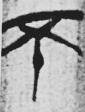不
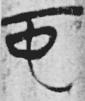𠁩
